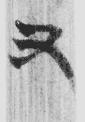又
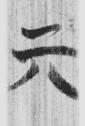亓
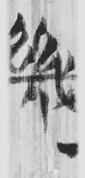幾
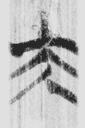夫
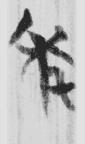年
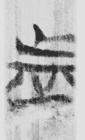者
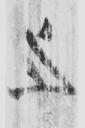之
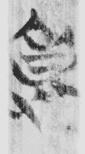事
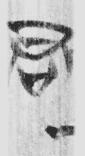君
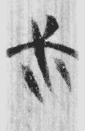必
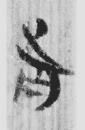歬
